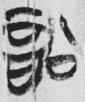訟（容）
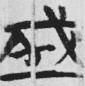城（成）
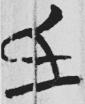氐（氏）
